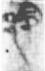邻
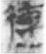連
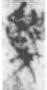○（敖）
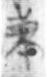東
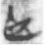臣
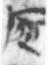所
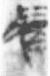馭（御）
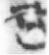政
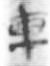車
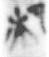○（漆）
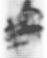○〈輪〉
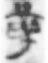革
